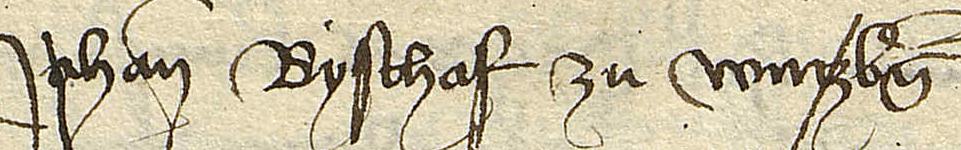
Iohan* Byſchof cʒu wircʒb*g
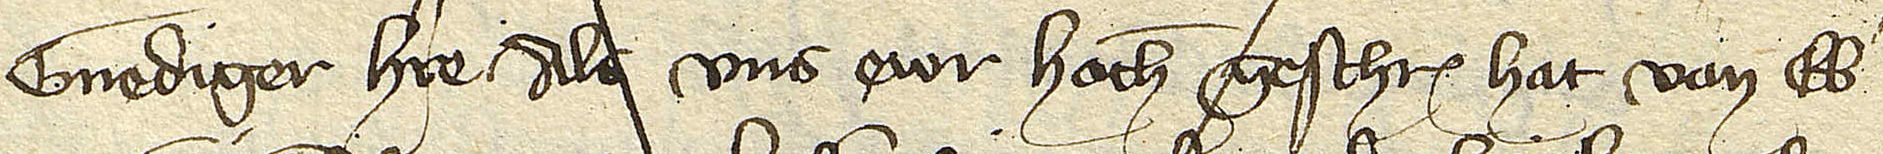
Gnediger h*re / Als vns ewr hoch* geſchr* hat von Eb*
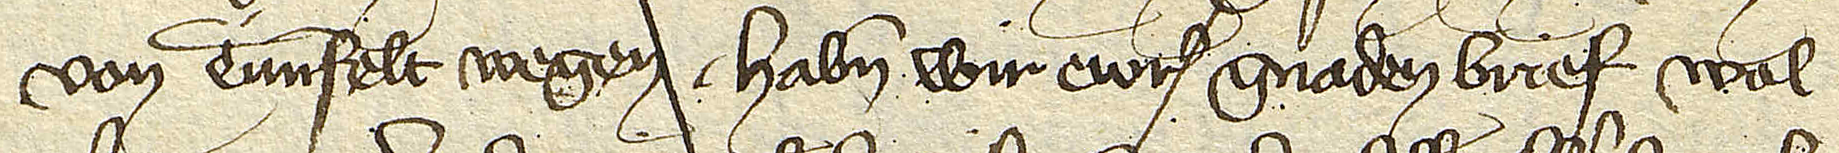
von Tün*felt wegen / habn* wir ewr* gnaden brief wol
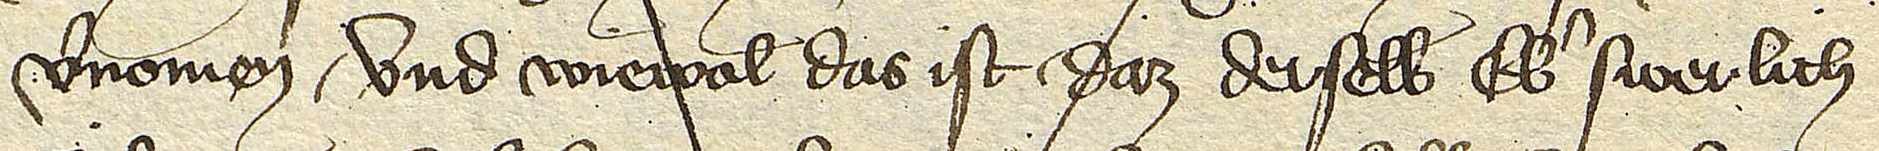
v*nomen / vnd wiewol das iſt / daʒ derſelb Eb* ſwerlich
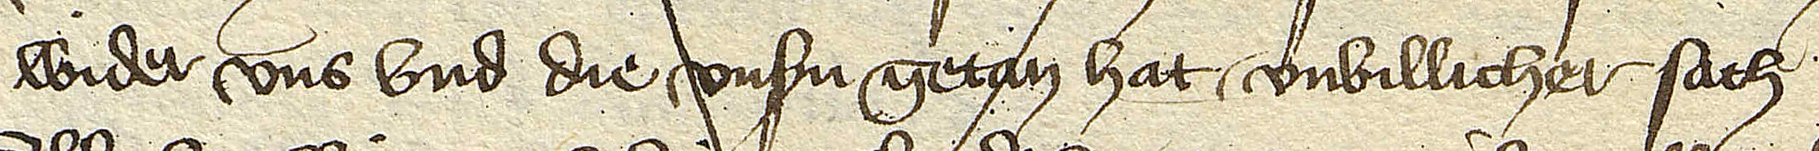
wider vns vnd die vnſ*n getan hat / vnbillicher ſach
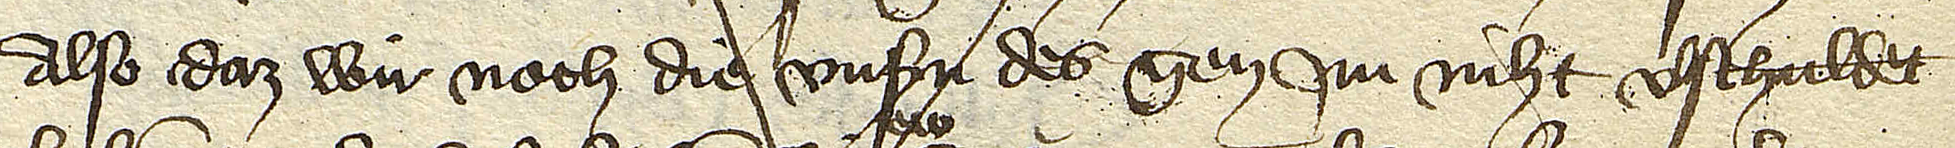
Alſo / daʒ wir noch die vnſ*n des gen Im niht v*ſchuldet
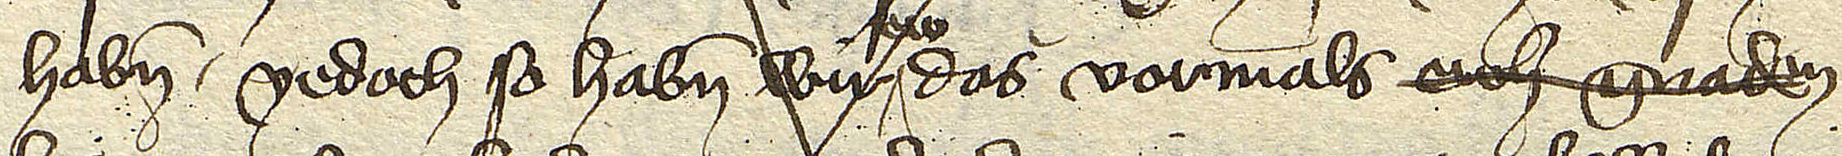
habn* / yedoch ſo habn* wir das vormals ewn* gnaden
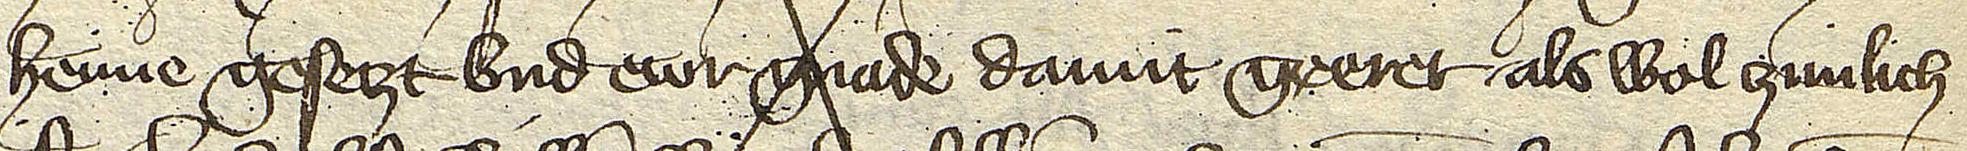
heime geſecʒt vnd ewr gnade damit geeret / als wol cʒimlich
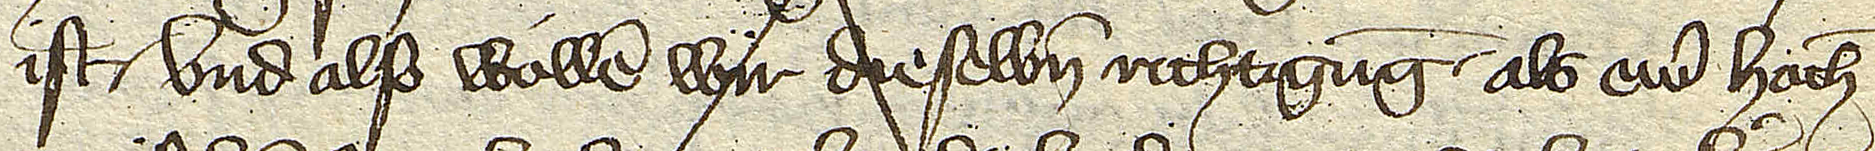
iſt / Vnd alſo wölle* wir dieſelbn* richtigug* / als ew* hoch*
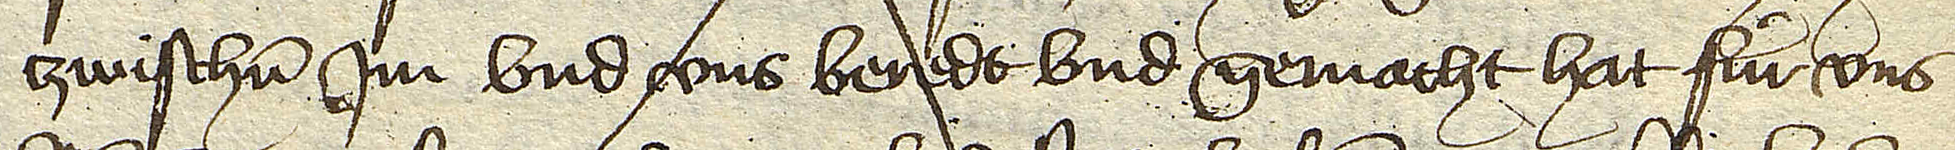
cʒwiſchn* Im vnd vns beredt vnd gemacht hat für vns
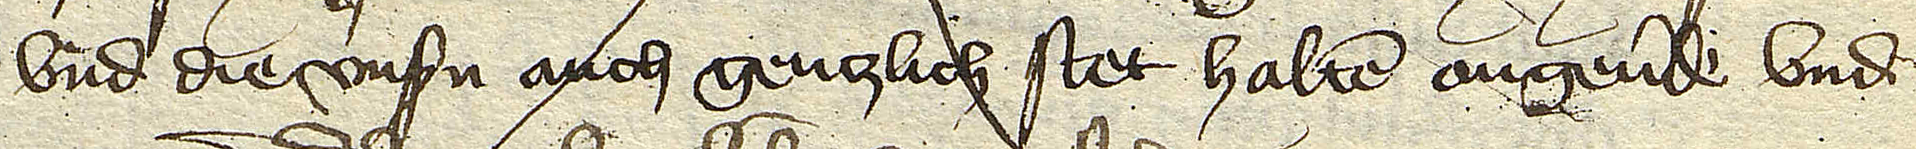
vnd die vnſ*n auch gencʒlich ſtet halte* ongeu*de vnd
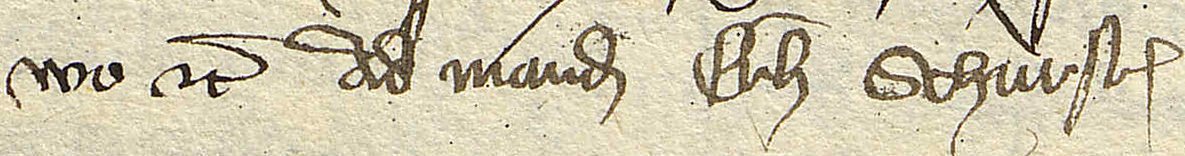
wo ec* Ad mand Erh* Schurſt*
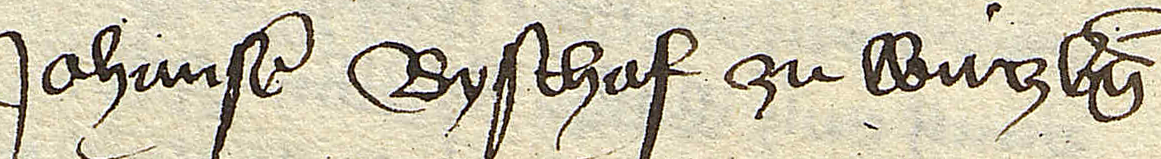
Iohanſe* Byſchof cʒu wircʒb*g
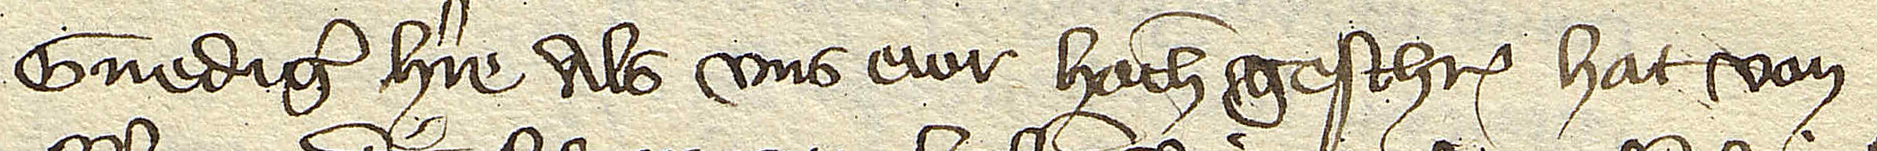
Gnedig* h*re Als vns ewr hoch* geſchr* hat von
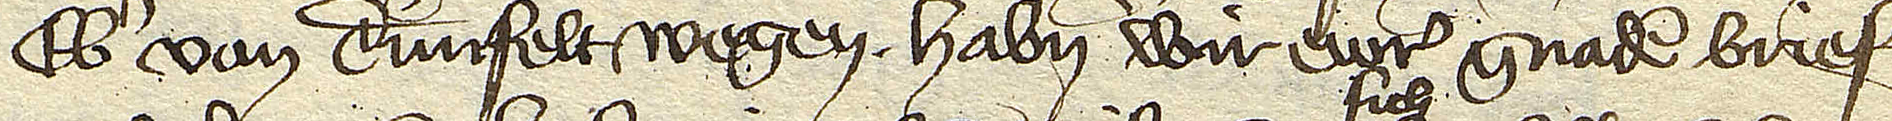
Eb* von Tünfelt wegen / habn* wir ewr* gnad* brief
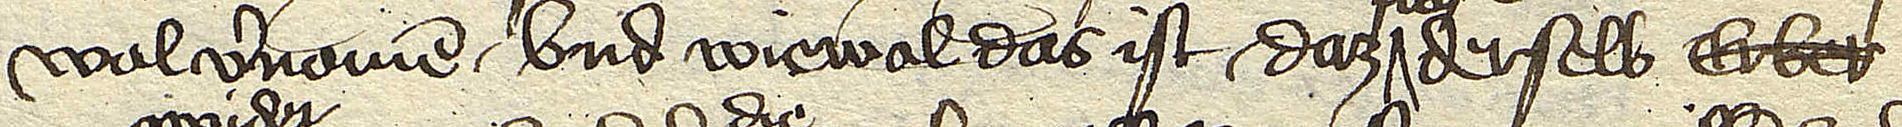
wol v*nome* / vnd wiewol das iſt / daʒ derſelb Erber
